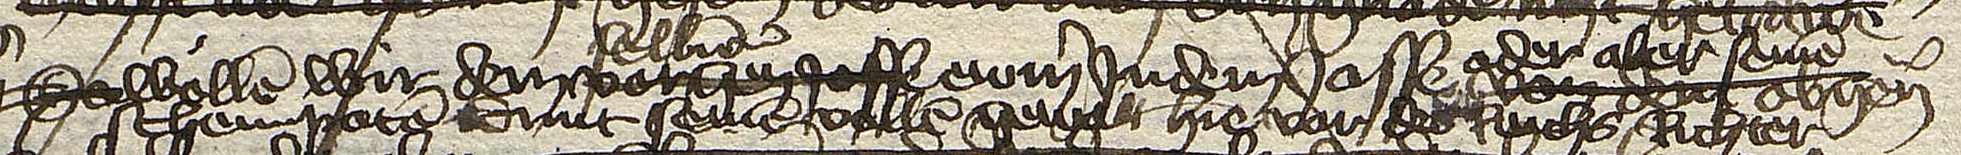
So wölle* wir dem vorgen* Ioſſe ewm* Iudem Ioſſe von dem obgen*
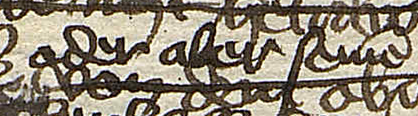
oder aber ſeine*
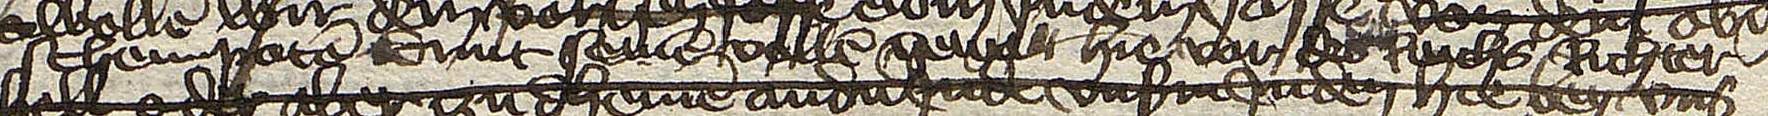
ſcheinpote* mit ſeine* volle* gewalt hie vor des Reichs Richter
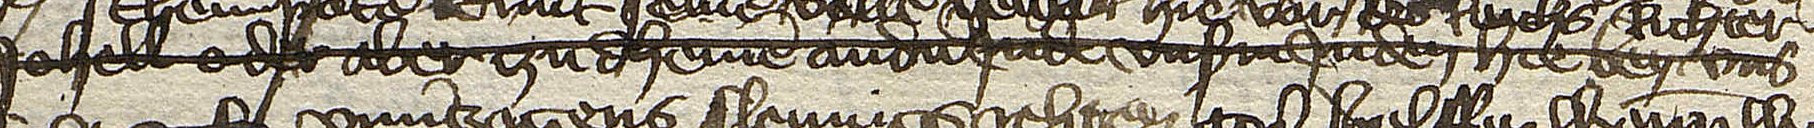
Iohell oder aber cʒu dheine* andn* Iude vnſ*m Iuden hie bey vns
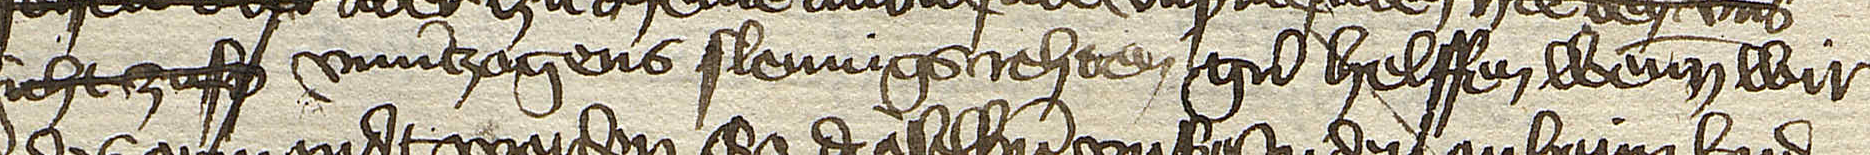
icht cʒuſp vnu*cʒogens ſleunigs rehten gn* helffen wenn* wir
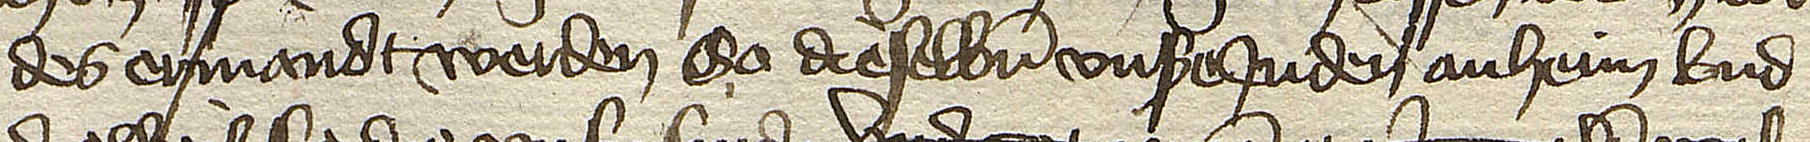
des ermandt werden So dieſelbn* vnſ*e Iuden anheim vnd
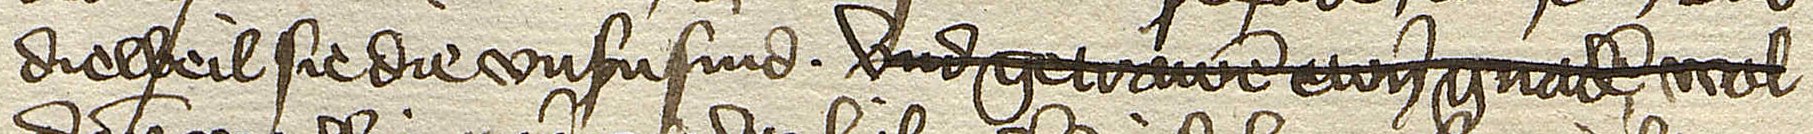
dieweil ſie die vnſ*n ſind . Vnd getrawe* ewn* gnade* wol
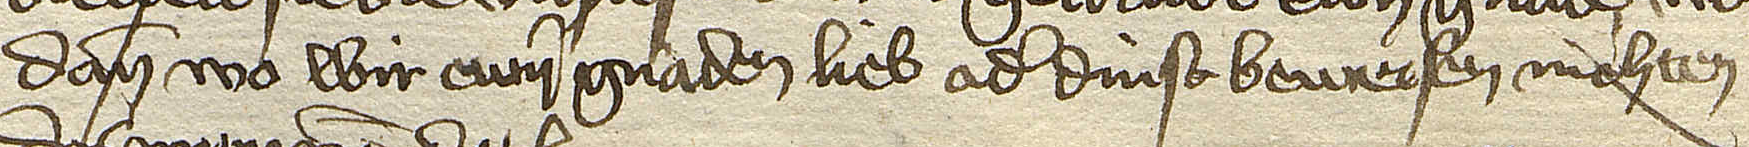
dan* wo wir ewn* gnaden lieb od* dinſt beweiſen möhten
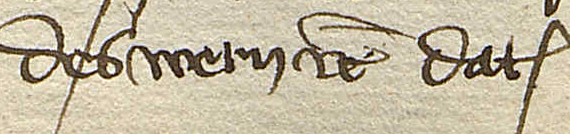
des wern ec* dat*
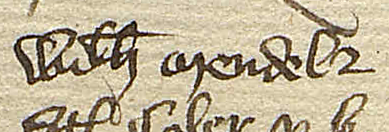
Wilh* Mendel @
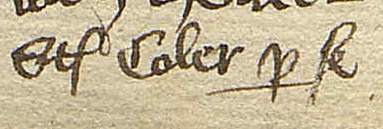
St* Coler p* ſe
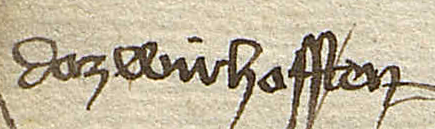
daʒ wir hofften
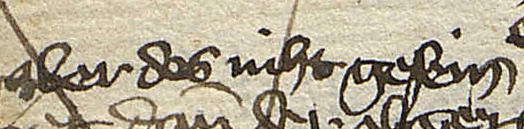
aber des niht geſein
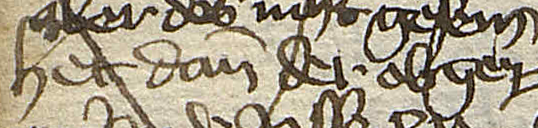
het dan* der obgen*
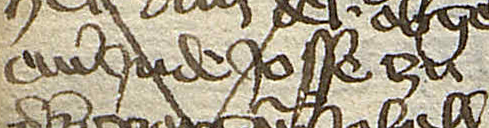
ew* Iude Ioſſe cʒu
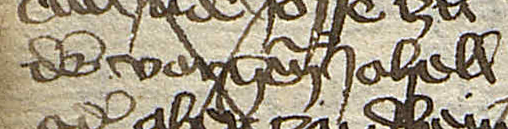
de* vorgen* Iohell
